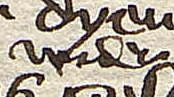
wider
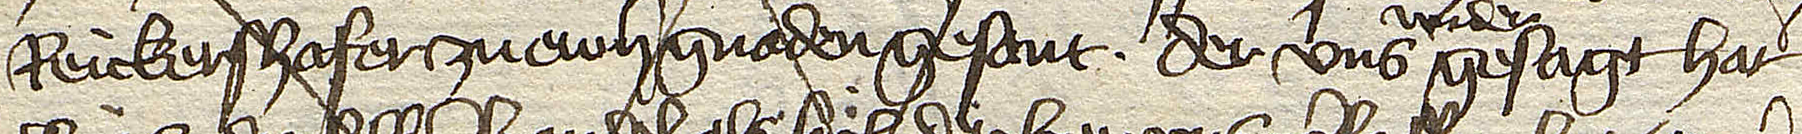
Reickerſhofer cʒu ewn* gnaden geſant . der vns geſagt hat
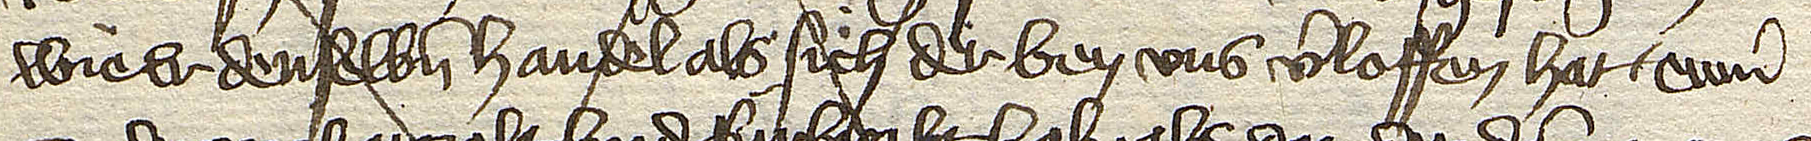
wie Er denſelbn* handel als ſich der bey vns v*ſloſſen hat / ewn*
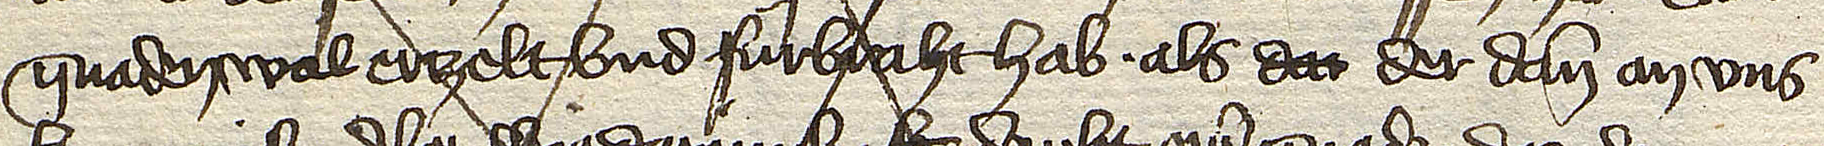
gnaden wol ercʒelt vnd fürbraht hab . als dar der dan* an vns
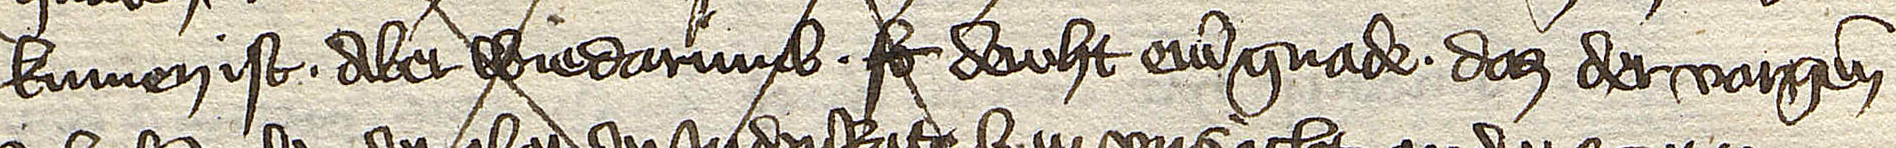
kumen iſt . Aber wie darümb . ſo dewht ew* gnade . daʒ der vorgen*
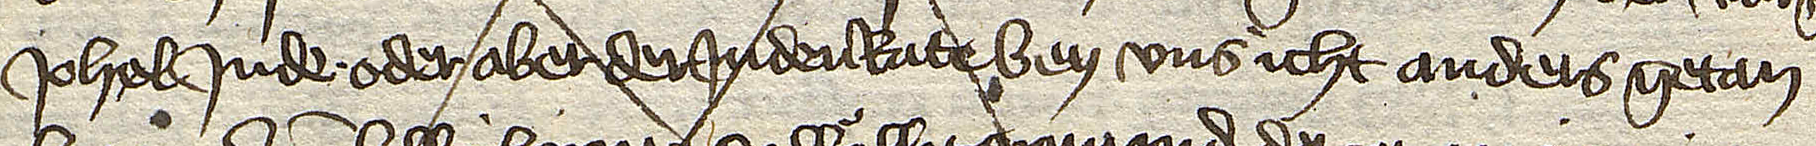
Iohel Iuden . oder aber der Iuden Rate bey vns icht anders getan
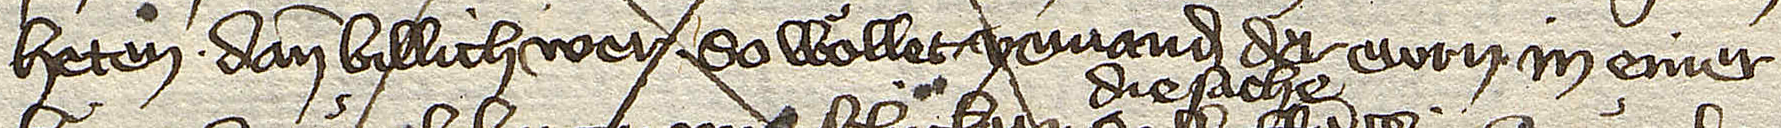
heten dan* billich wer . So wöllet / yemand* der ewrn in einer
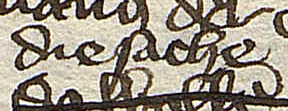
die ſache
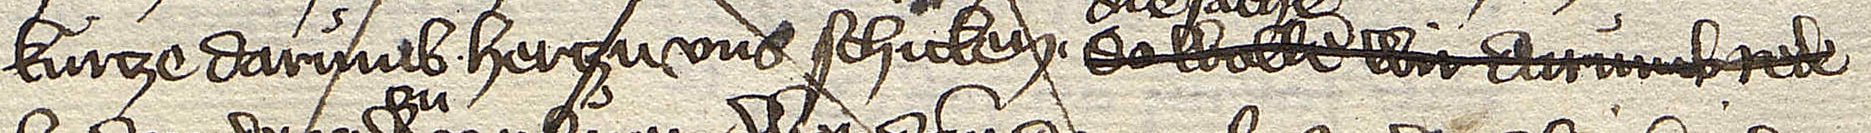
kürcʒe darümb hercʒu vns ſchicken . So wolle* wir darümb rede
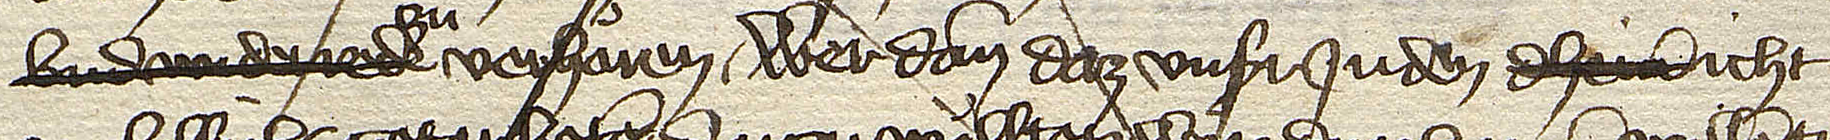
vnd widerrede verhören / Wer dan* daʒ vnſ*r Iuden dhein* icht
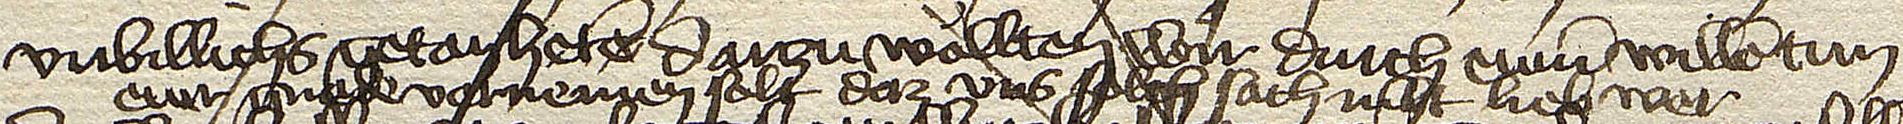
vnbillichs getan hete* Darcʒu wöllte wir durch ewn* wille* tun
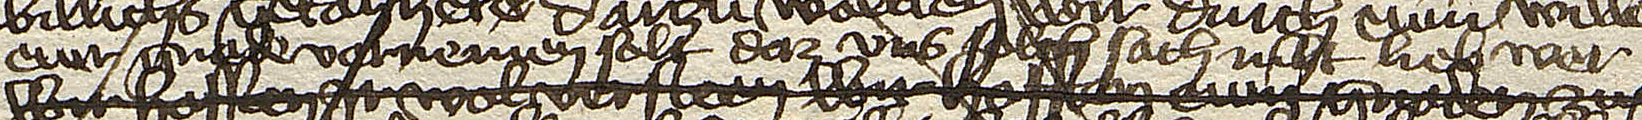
ewr gnade vernemen ſolt daʒ vns ſolch ſach niht lieb wer
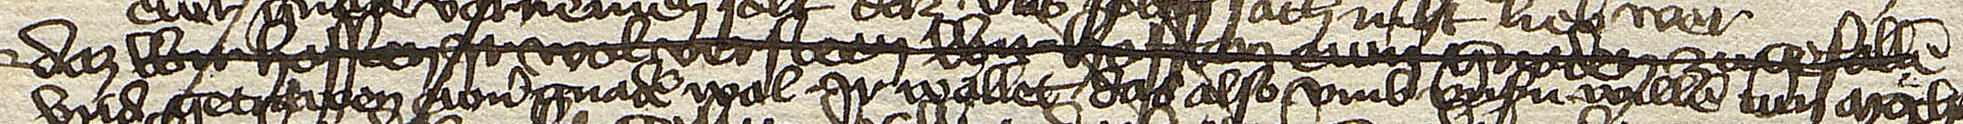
daʒ wir hoffen Ir wol verſteen wir hofften ewn* gnaden cʒu gefalle*
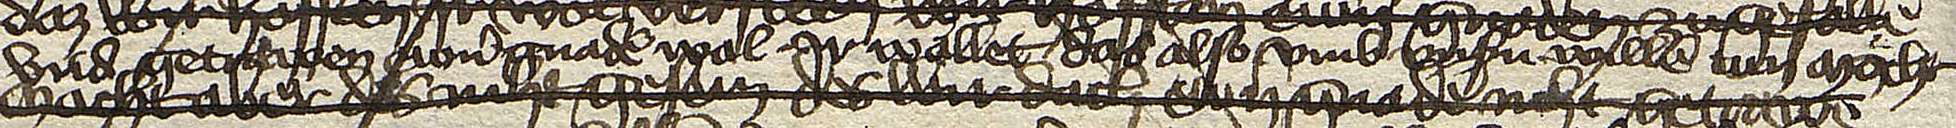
vnd getrawen ewn* gnade* wol Ir wollet das alſo vmb vnſ*n wille* tun Möcht
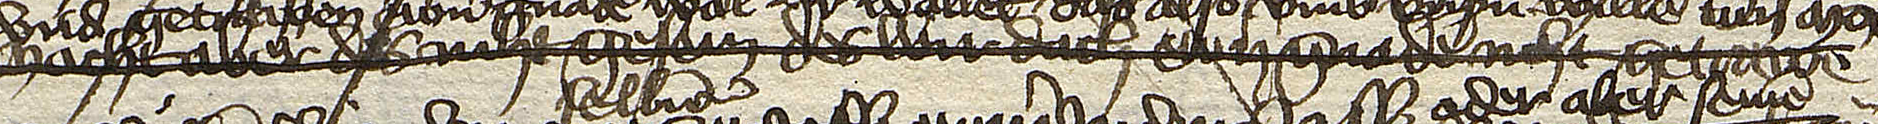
Möcht aber des niht geſein des wir doch ewn* gnade* niht getrawe
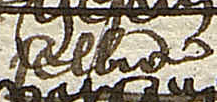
ſelbn*
